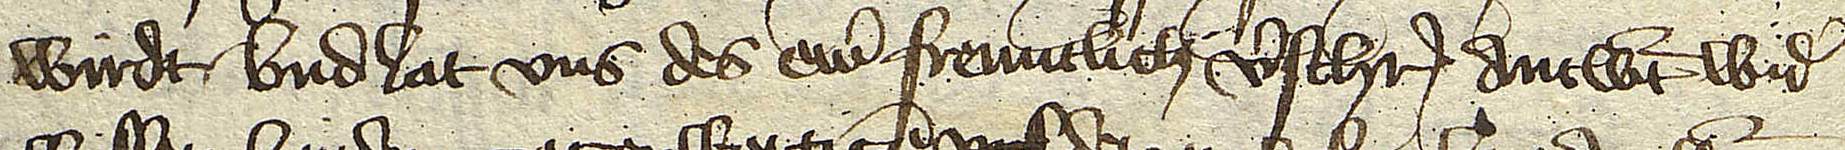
wirdt / vnd lat vns des ew* freuntlich v*ſchr* Antwt* wid*
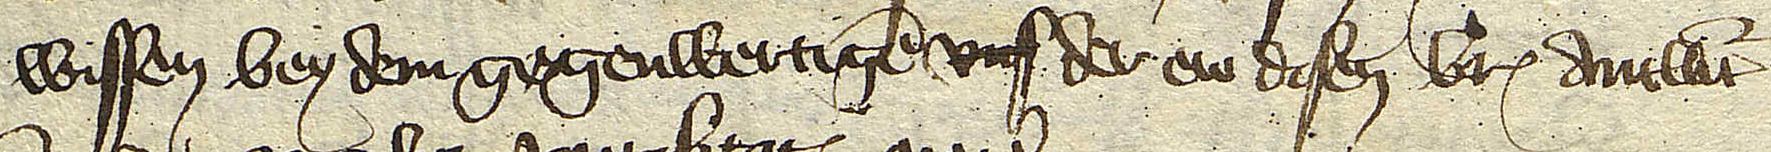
wiſſen bey dem gegenwertige* vnſ der ew diſen br* Antwt*
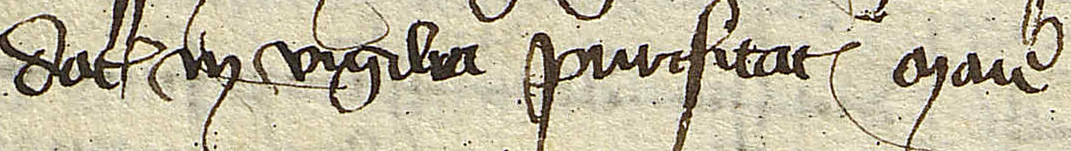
dat* in vigilia purificat* Maie*
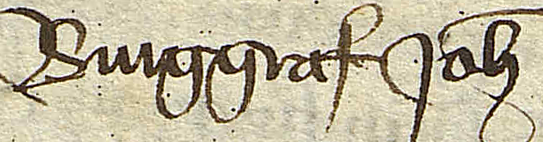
Burggraf Ioh*
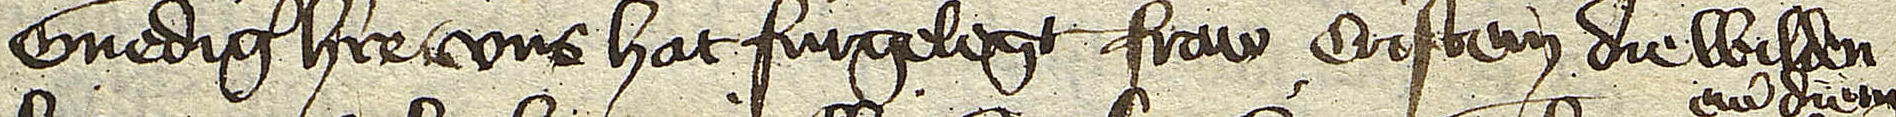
Gnedig* h*re / vns hat fürgelegt fraw Criſtein die wilden
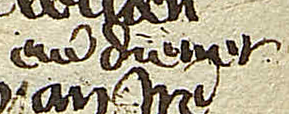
ew* diener
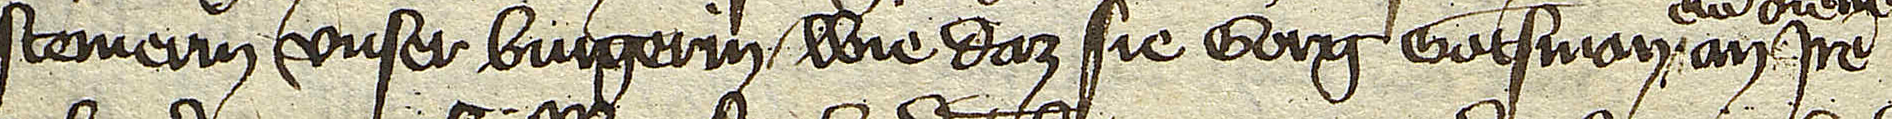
ſteinerin vnſer burgerin / wie daʒ ſie Görg Gotſman an Ire*
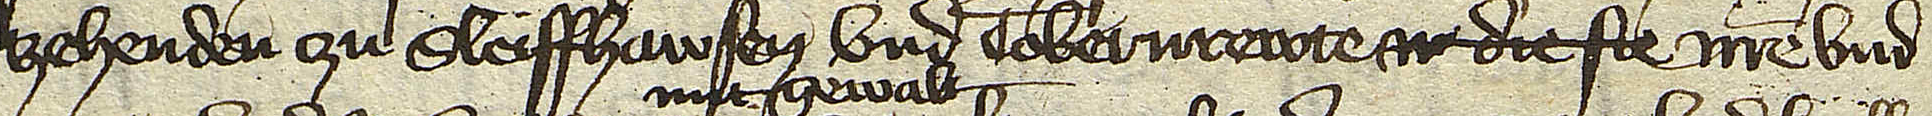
cʒehenden cʒu Sleiffhawſen vnd Tobernrewte ir die ſte irre vnd
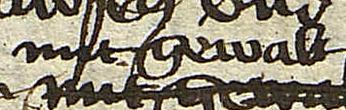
mit gewalt
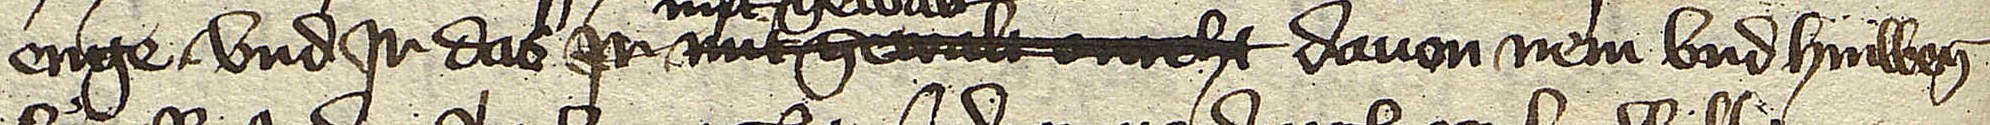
enge / vnd Ir das Ir mit gewalt onreht dauon nem vnd hinweg
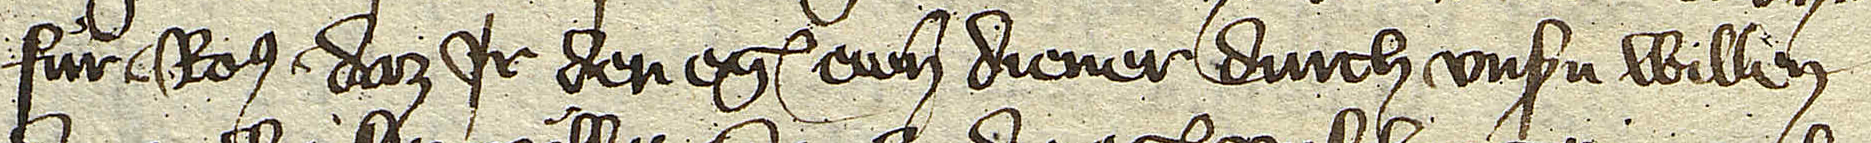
für / Ro* / daʒ Ir den eg* ewn* diener durch vnſ*n willen
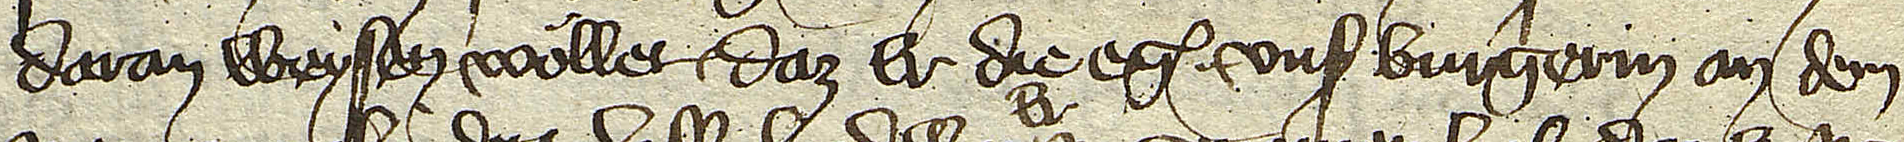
daran weyſen wöllet / daʒ Er die eg* ~ vnſ* burgerin an dem
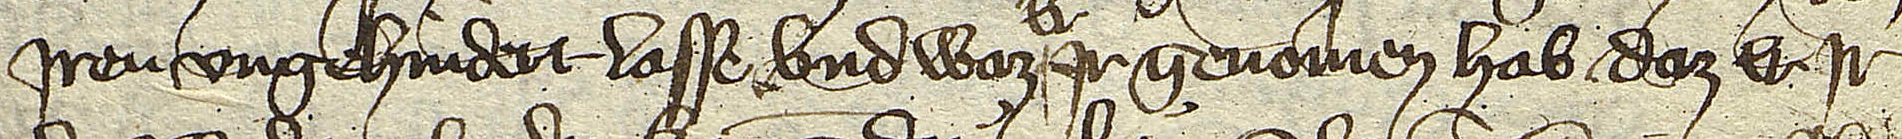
Iren vngehindert laſſe vnd waʒ Ir genomen hab / daʒ Er Ir
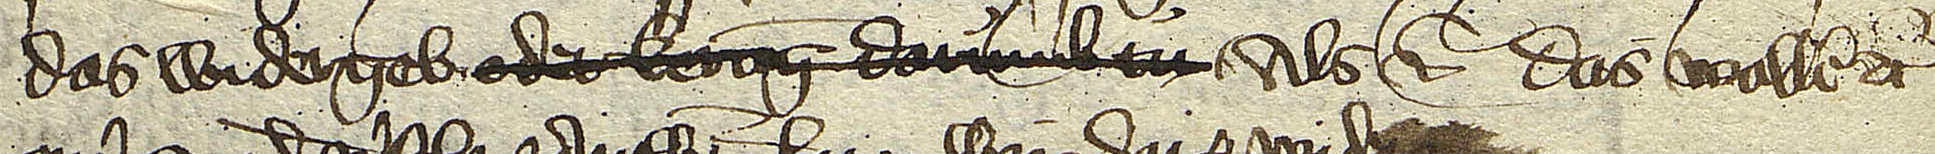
das widergeb oder kerug* darümb tü / Als ec* das wolle* ec*
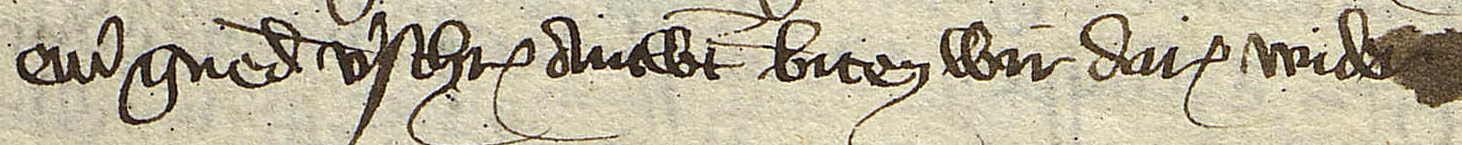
ew* gned* v*ſchr* Antwt* biten wir dar* wider
